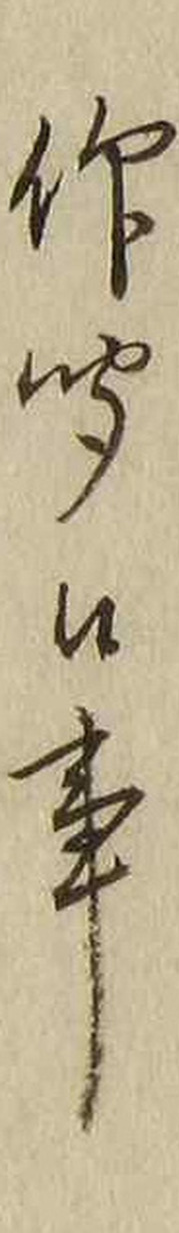仰出候事

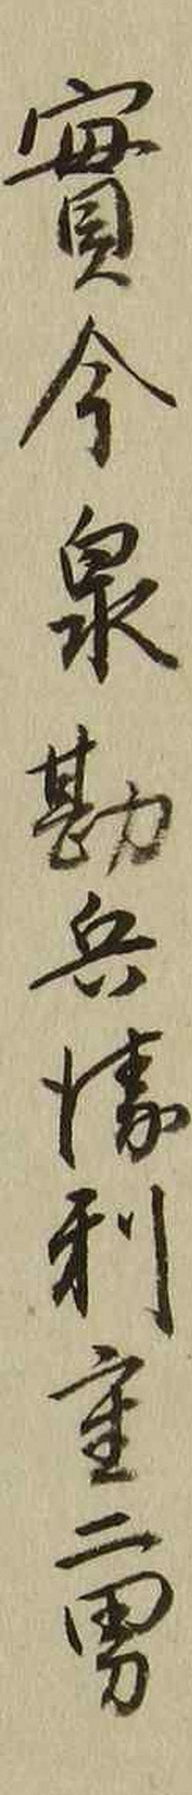実今泉勘兵衛利重二男
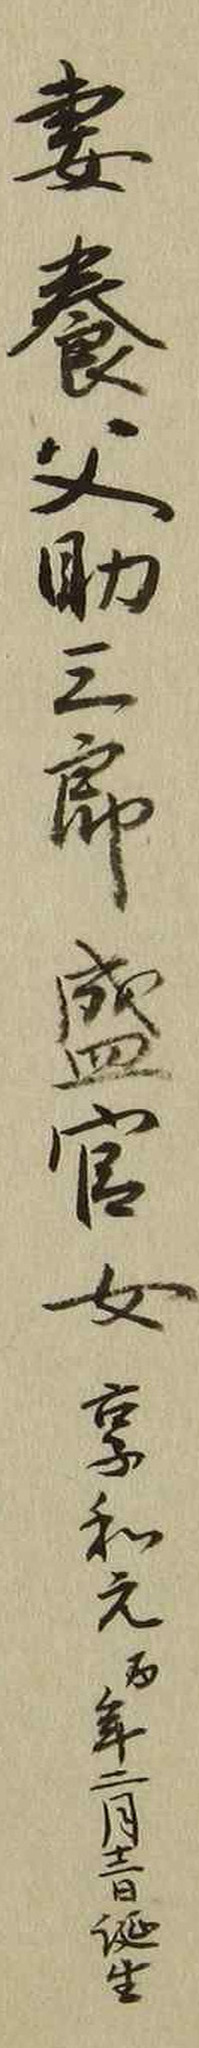妻養父助三郎盛官女享和元酉年二月十二日誕生
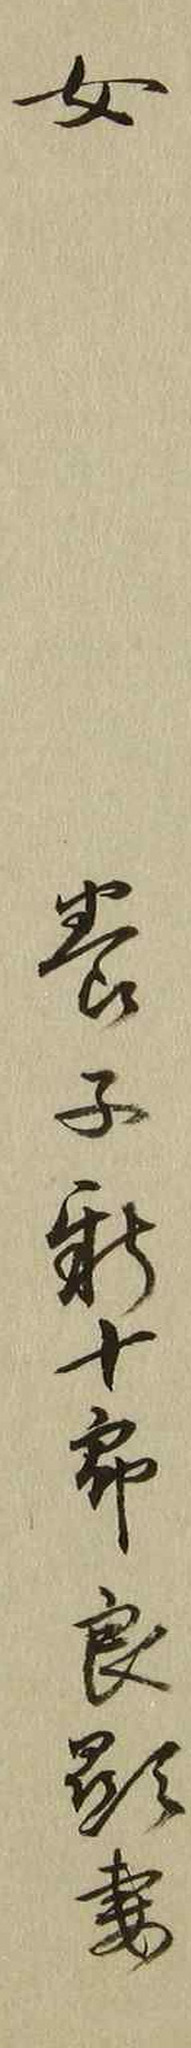女養子新十郎良顕妻
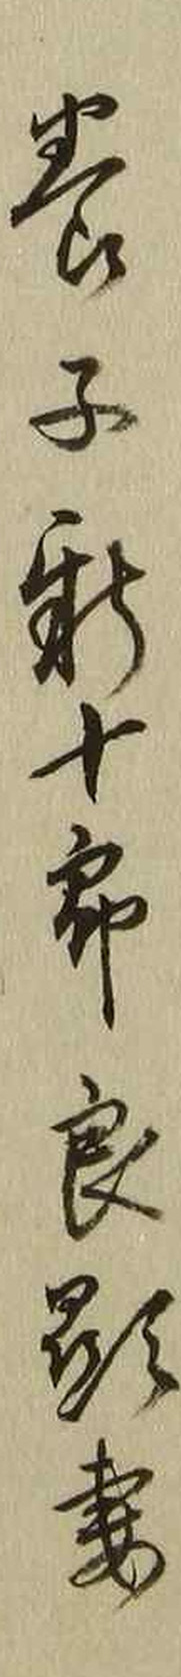女養子新十郎良顕妻
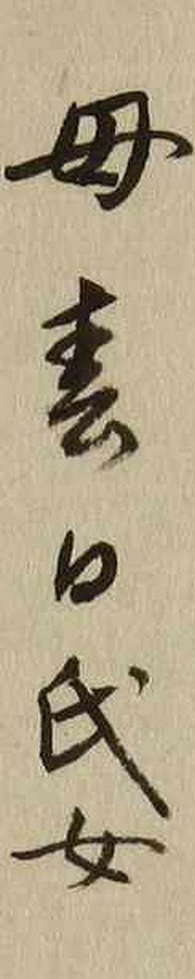母春日氏女
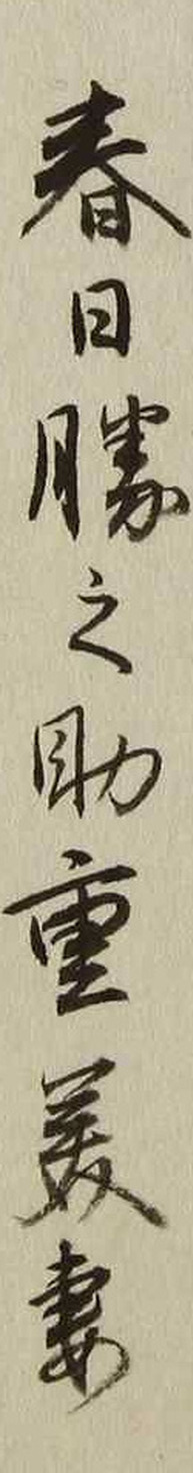女春日勝之助重義妻
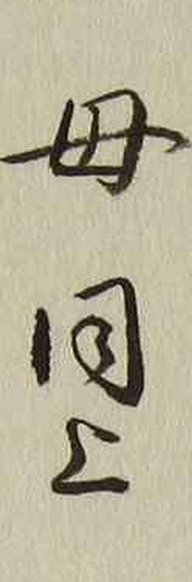母同上
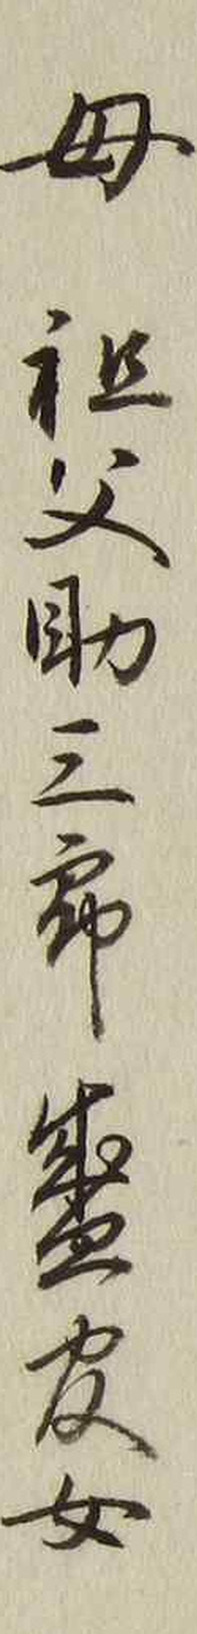母祖父助三郎盛官女

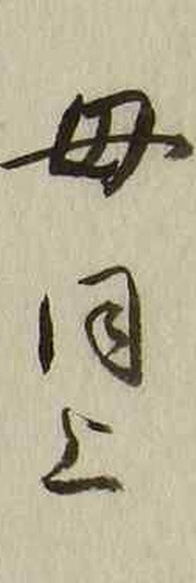母同上
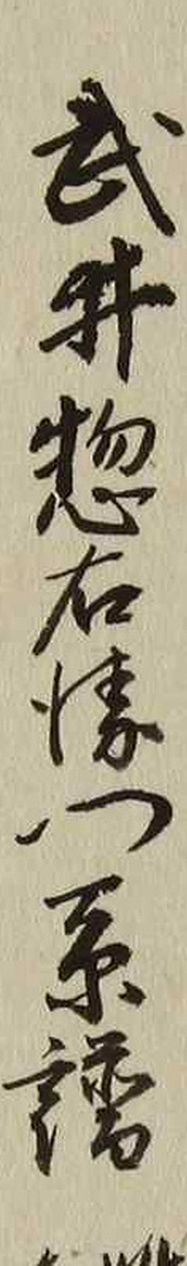武井小右衛門勝平
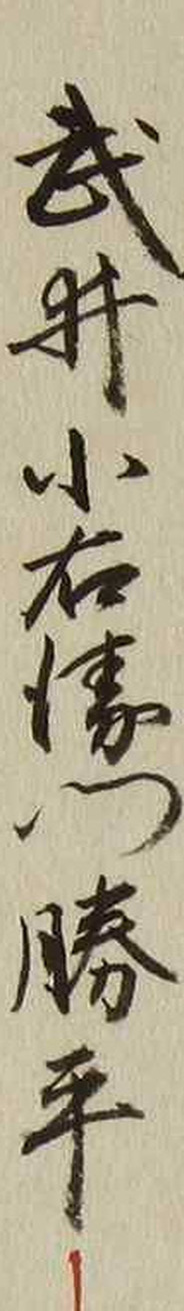武井小右衛門勝平

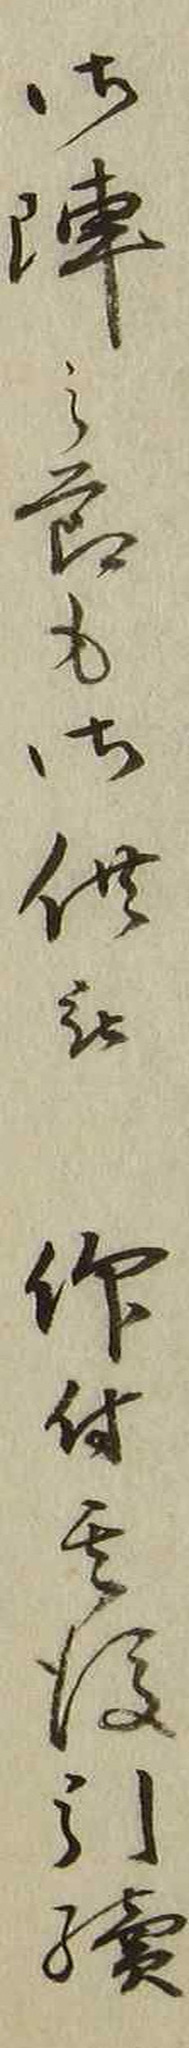御陣之節も御供被仰付其後引続
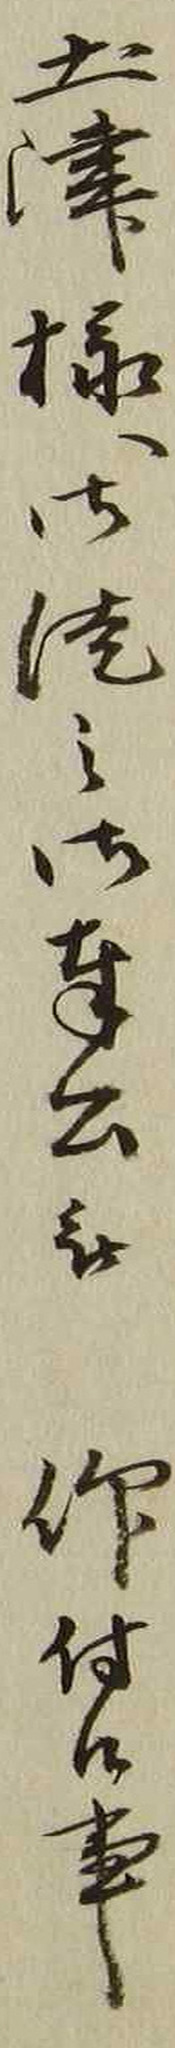土津様へ御徒之御奉公被仰付候事
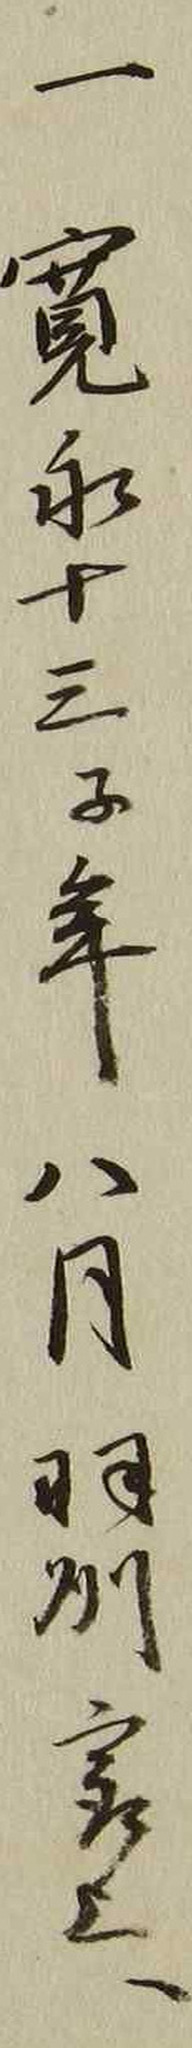一寛永十三子年八月羽州最上へ
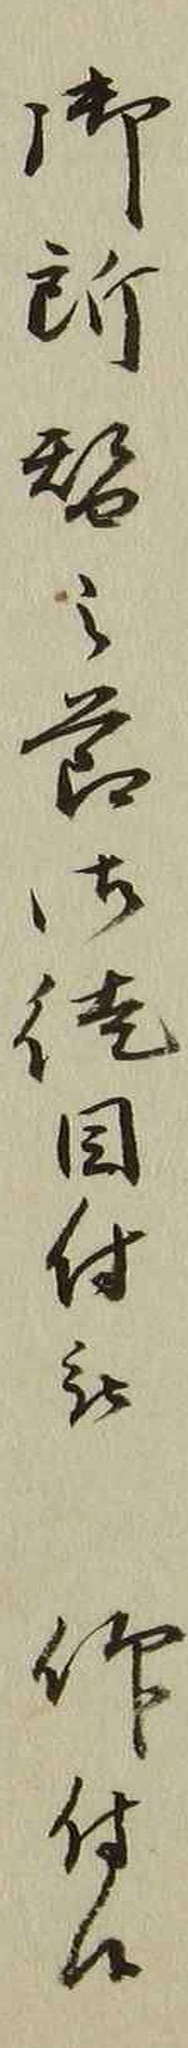御所替之節御徒目付被仰付候
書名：諸士系譜　巻之128　た之部4
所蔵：会津若松市立会津図書館
